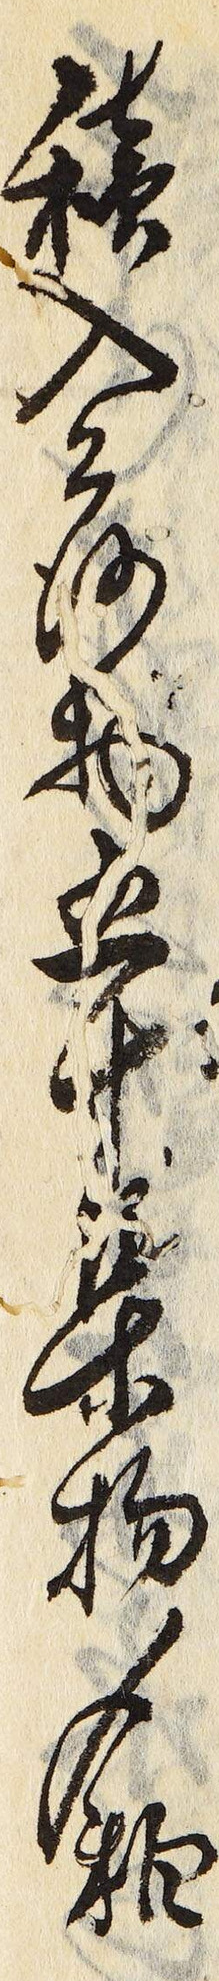積入荷物五十集物〆粕
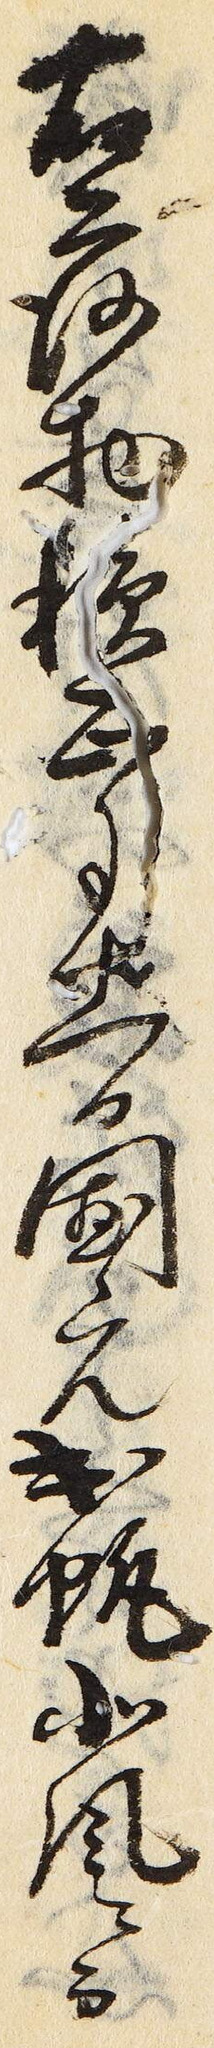右荷物積正月十一日国元出帆北風ニ而
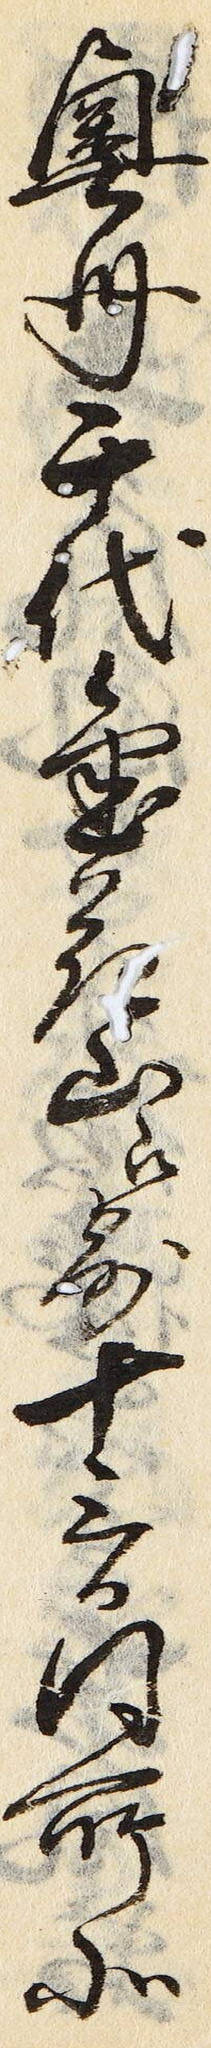奥州千代金花山え寄十三日同所北
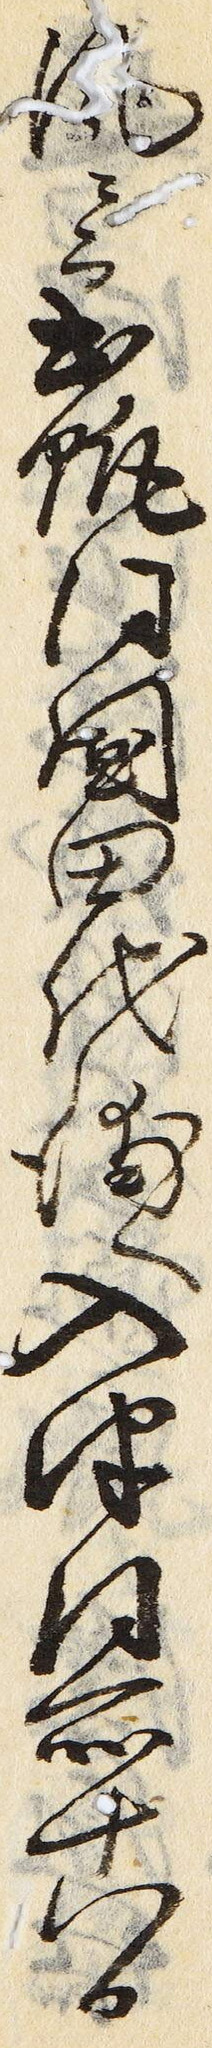風ニ而出帆同国田代浦へ入津同所十八日
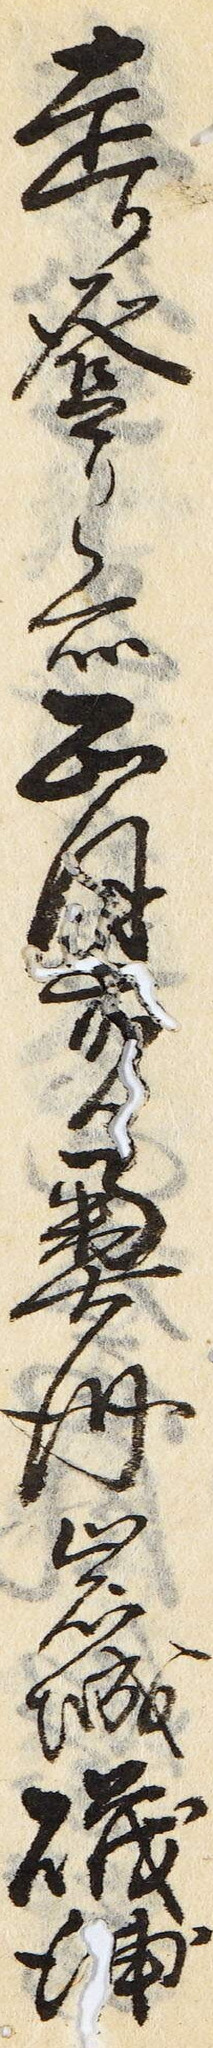走り登り候所正月廿日奥州岩城磯浦
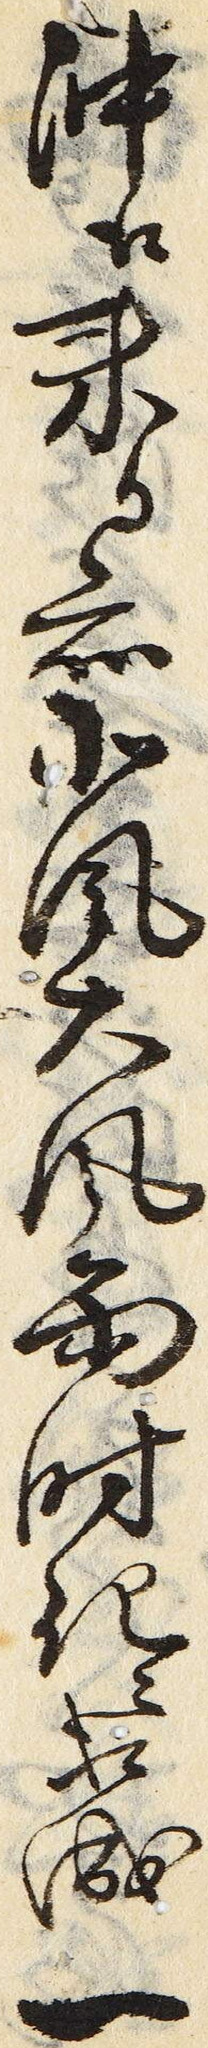沖え来り候所北風大風雨時化ニ相成一
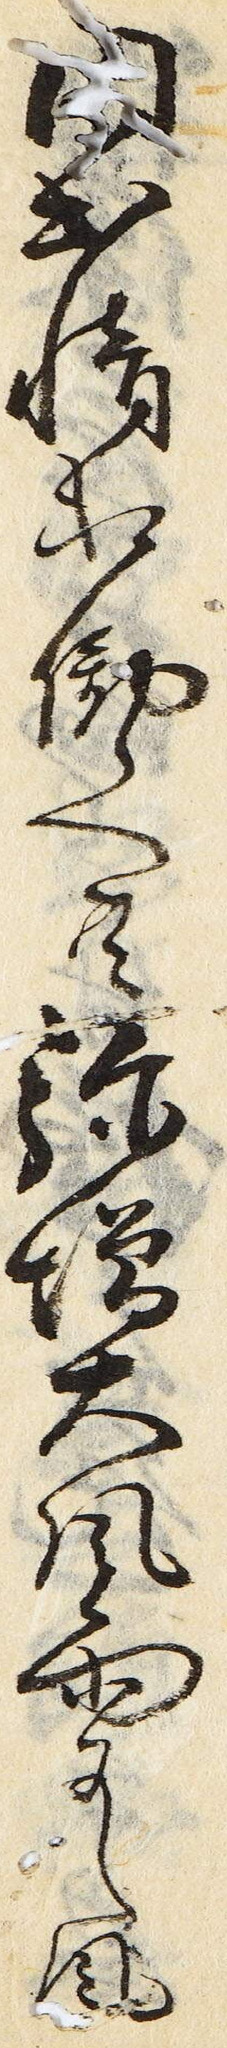同出情相働候へ共弥増大風雨にし風
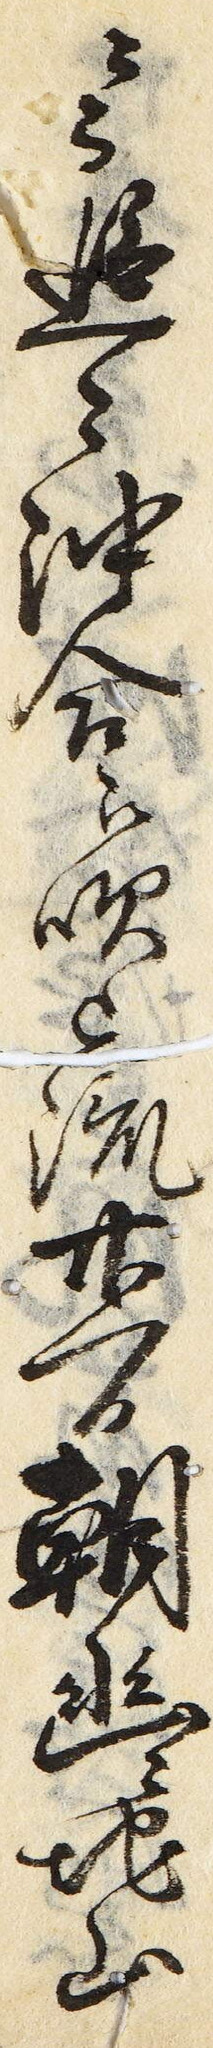ニ而追々沖合え吹被流廿一日朝幽ニ地山
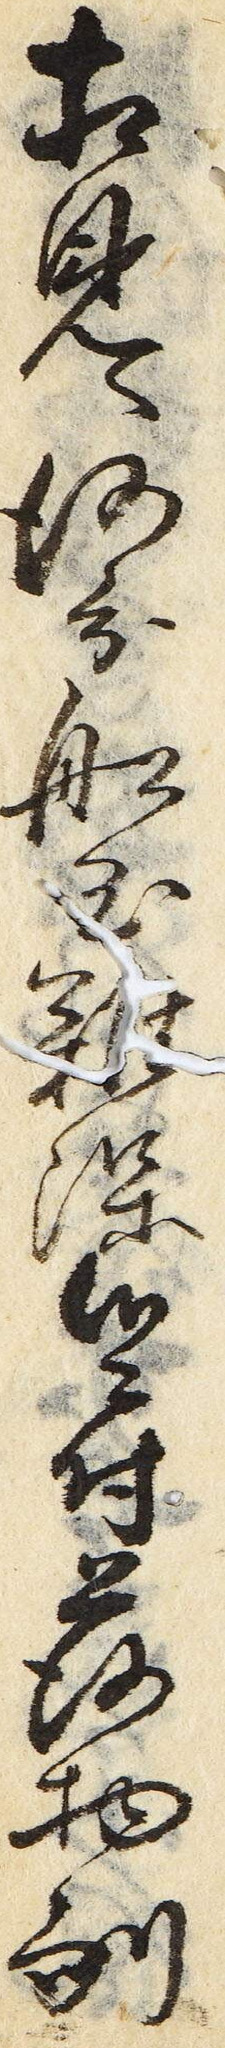相見へ何分船玉難保候ニ付荷物刎
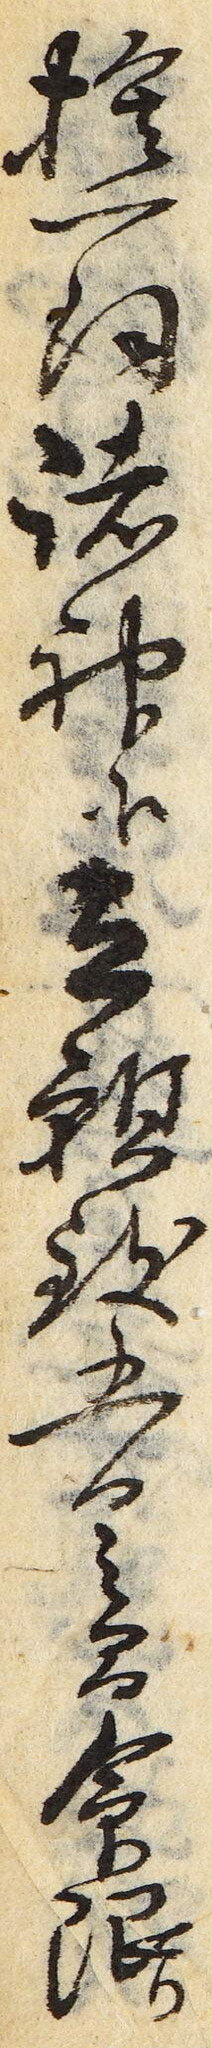捨一同諸神え立願致五日之間命限り

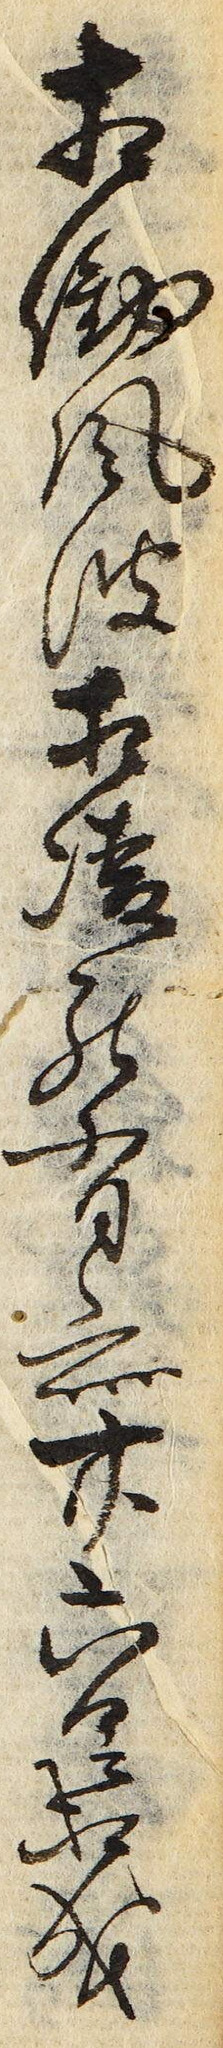相働風波相凌罷有候所廿六日ニ相成
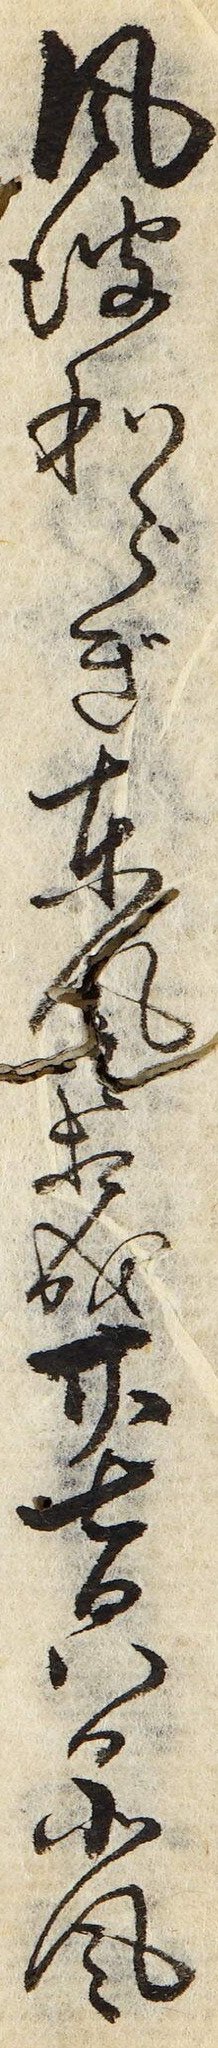風波和らぎ東風ニ相成廿七日八日北風
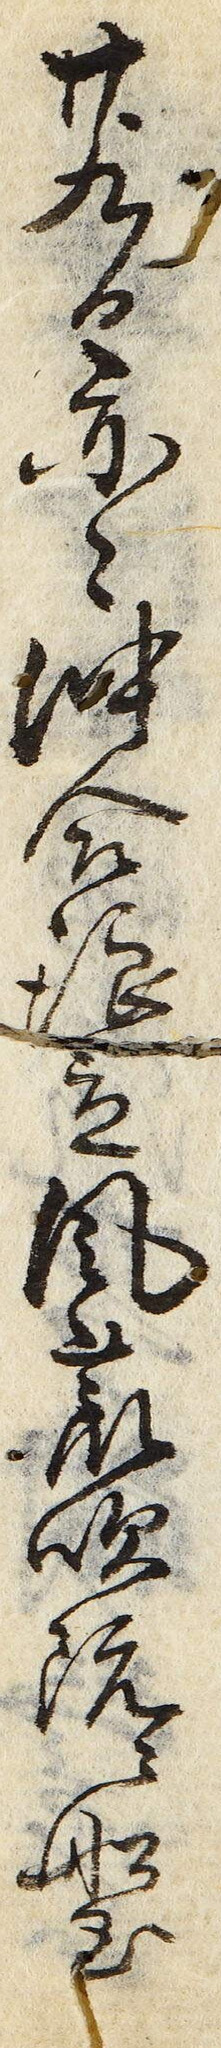廿九日亦々沖合浪立風荒吹既ニ船玉
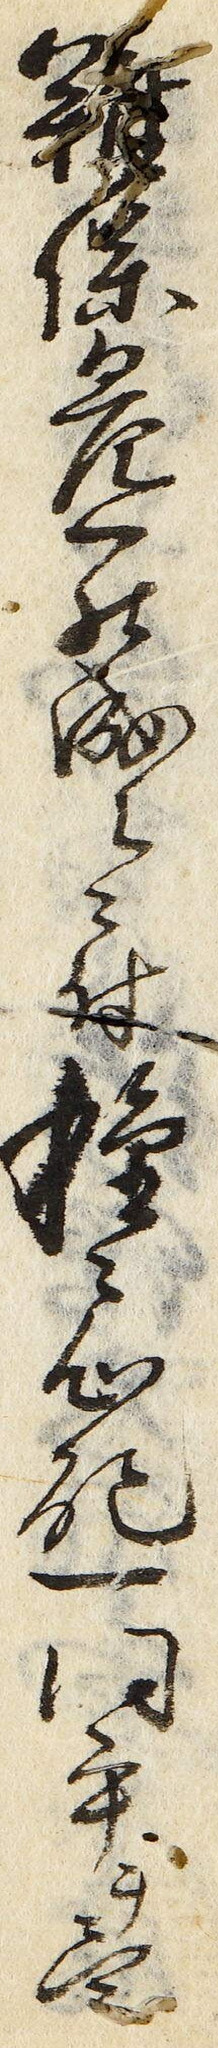難保危罷成候ニ付種々心配一同手ヲ尽
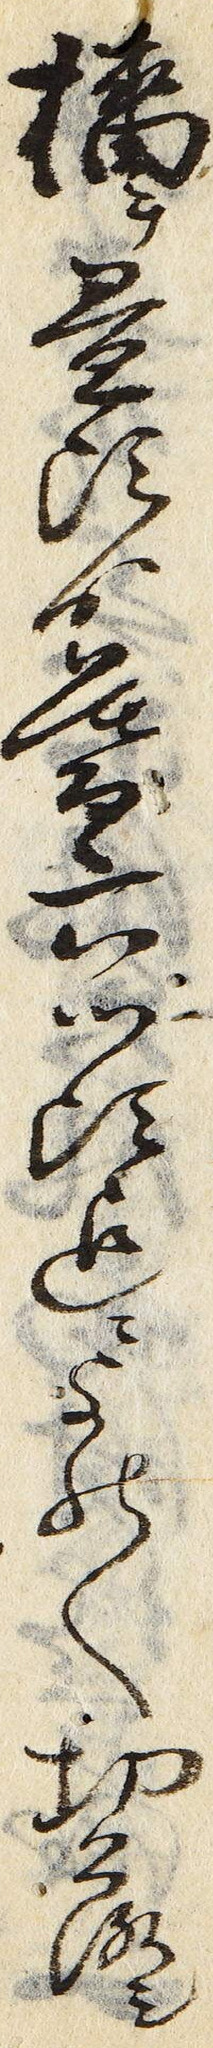檣ヲ昼頃ゟ暮六ツ頃迄ニよの〳〵？切落シ
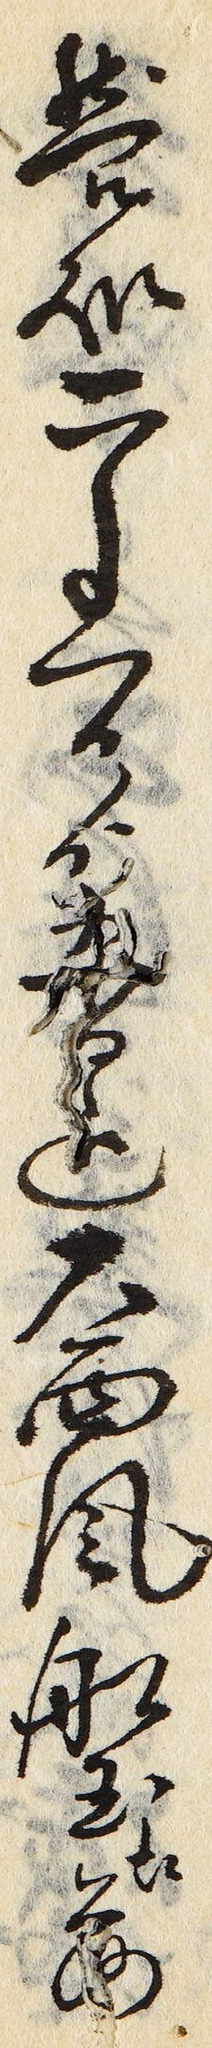然ル処二月一日ゟ日迄大西風船玉え荷
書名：阿波幸宝丸漂流記
